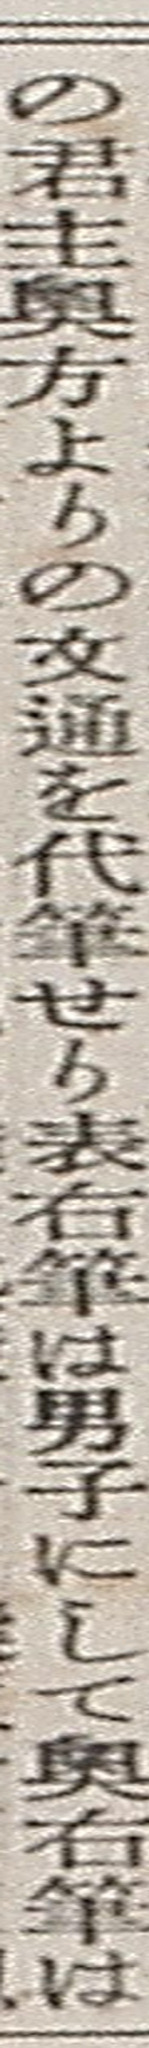の君主奥方よりの文通を代筆せり表右筆は男子にして奥右筆は
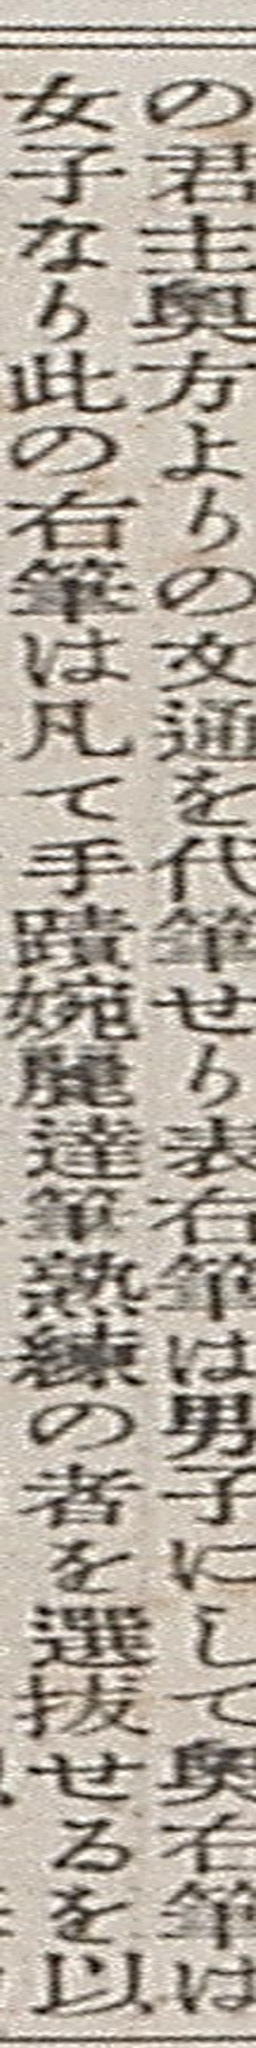女子なり此の右筆は凡て手蹟婉麗達筆熟練の者を選抜せるを以
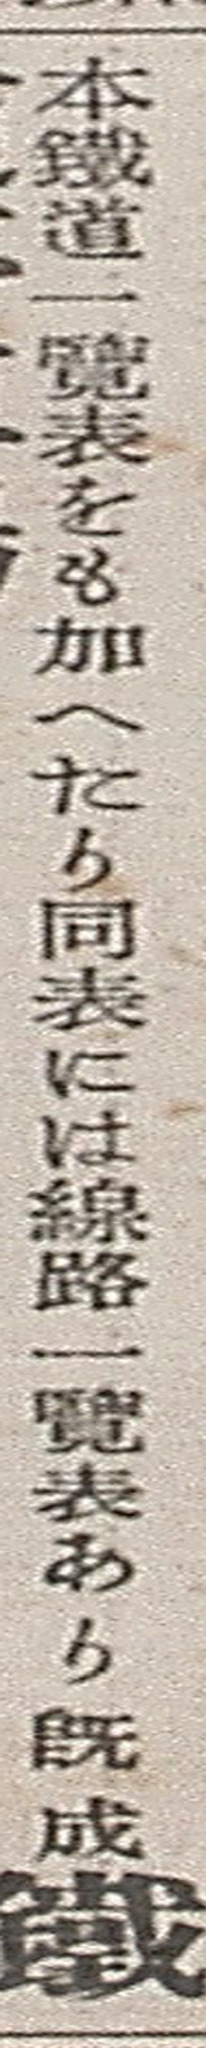本鉄道一覧表をも加へたり同表には線路一覧表あり既成鉄
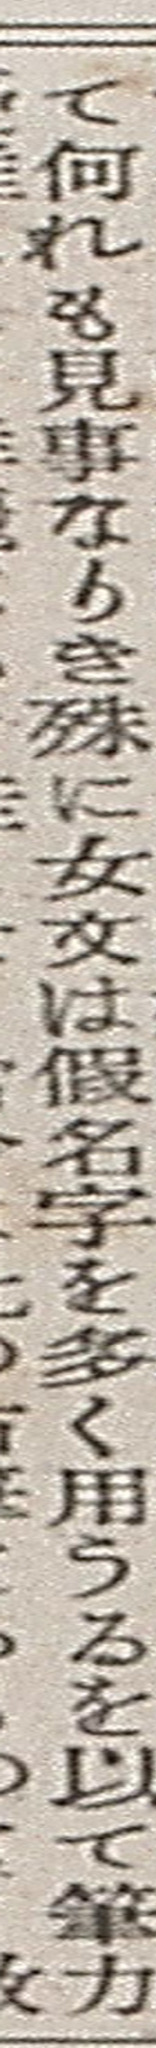て何れも見事なりき殊に女文は仮名字を多く用うるを以て筆力
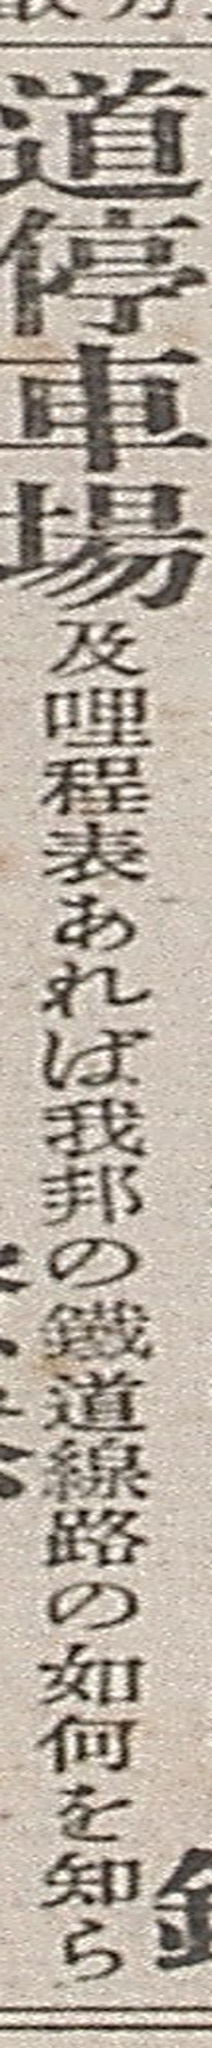道停車場及哩程表あれば我邦の鉄道線路の如何を知ら
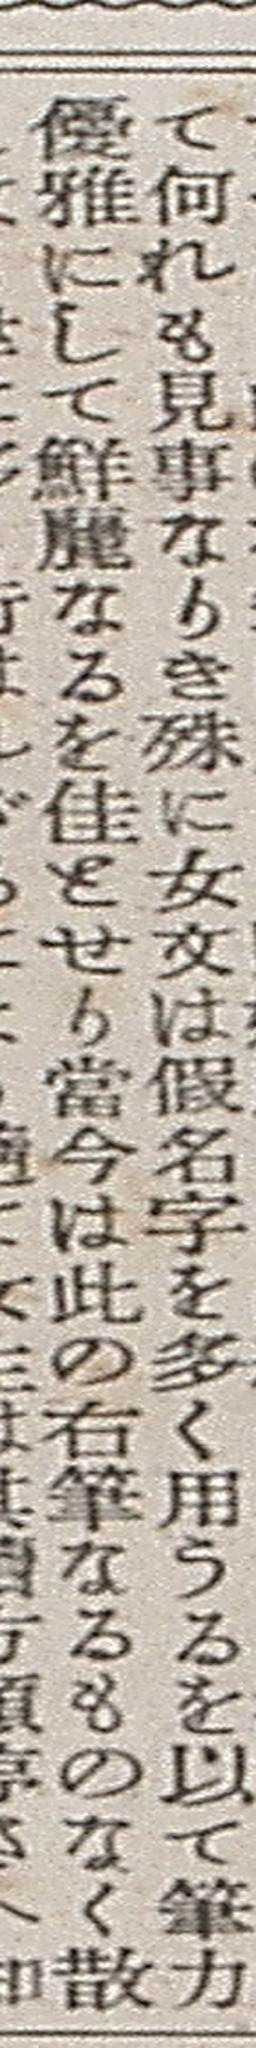優雅にして鮮麗なるを佳とせり当今は此の右筆なるものなく散
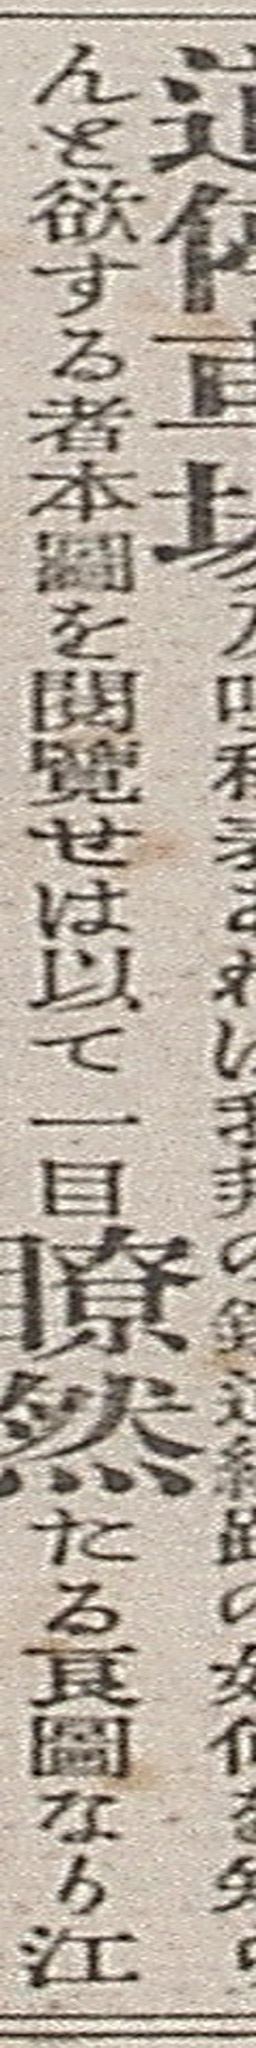んと欲する者本図を閲覧せは以て一目瞭然たる良図なり江
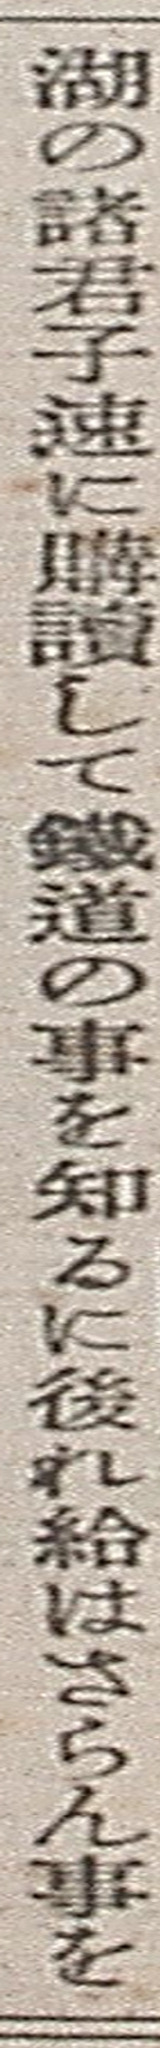湖の諸君子速に購読して鉄道の事を知るに後れ給はさらん事を
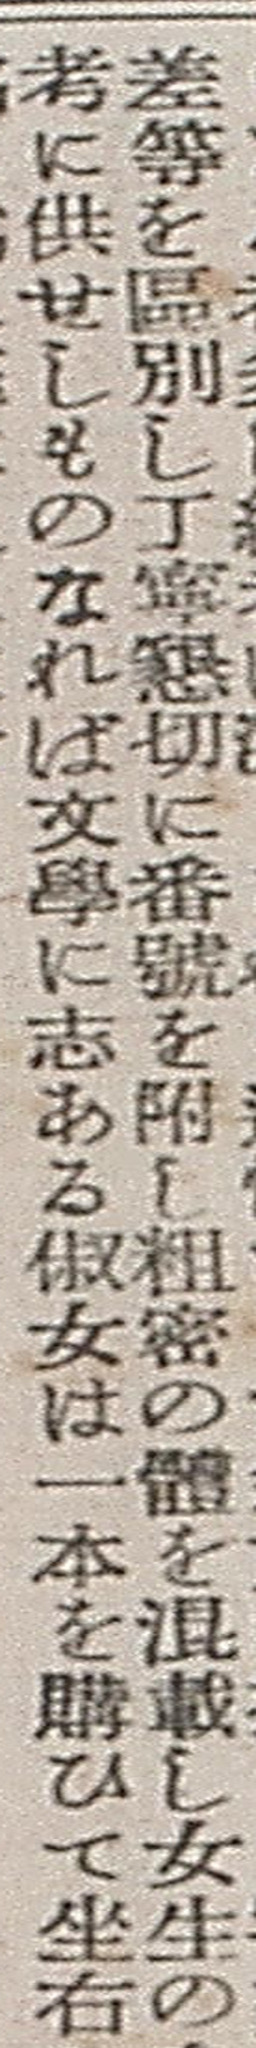考に供せしものなれば文学に志ある淑女は一本を購ひて座右の
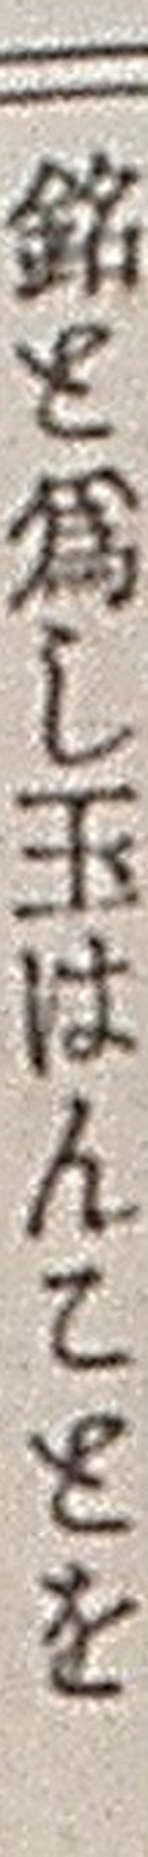銘と為し玉はんことを
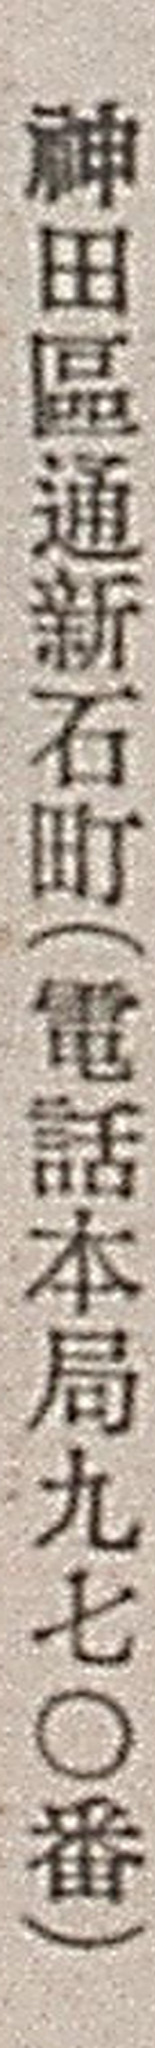神田区通新石町電話本局九七〇番
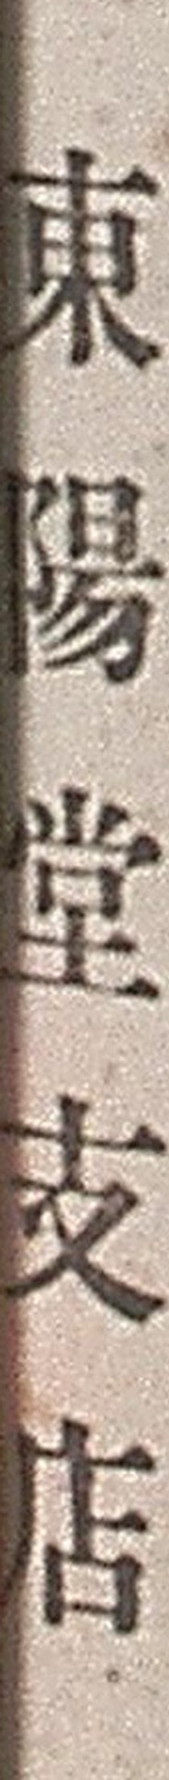東陽堂支店
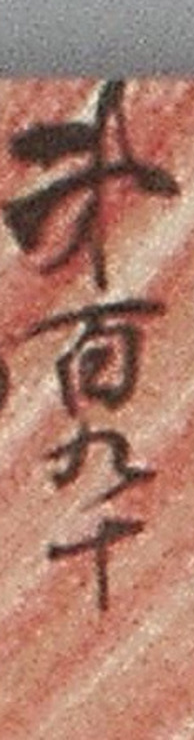第百九十
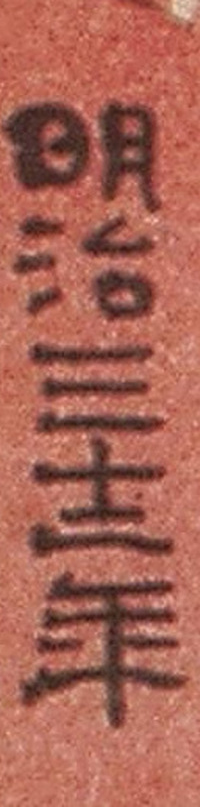明治三十二年
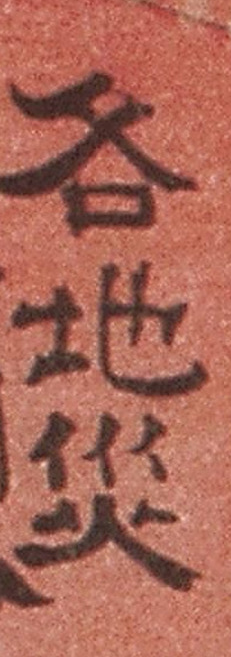各地災
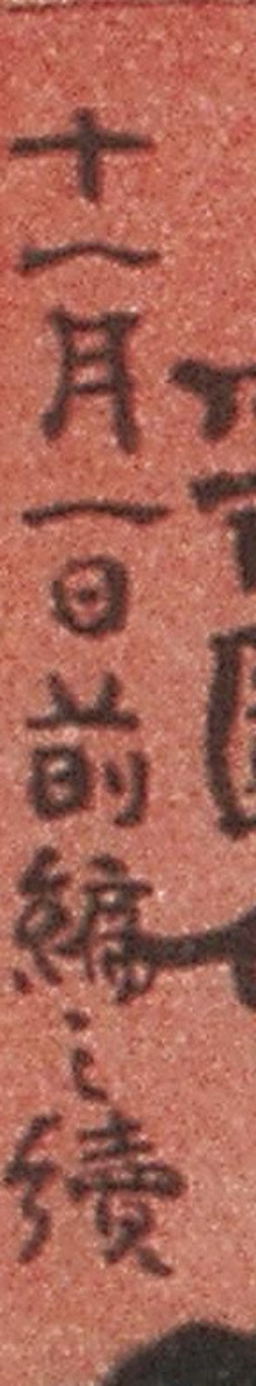十一月一日前編之續
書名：風俗畫報臨時増刊第百九十九號　明治三十二年十月各地災害圖會（前編之續）
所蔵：東京大学地震研究所図書室 Earthquake Research Institute Library, The University of Tokyo, JAPAN
